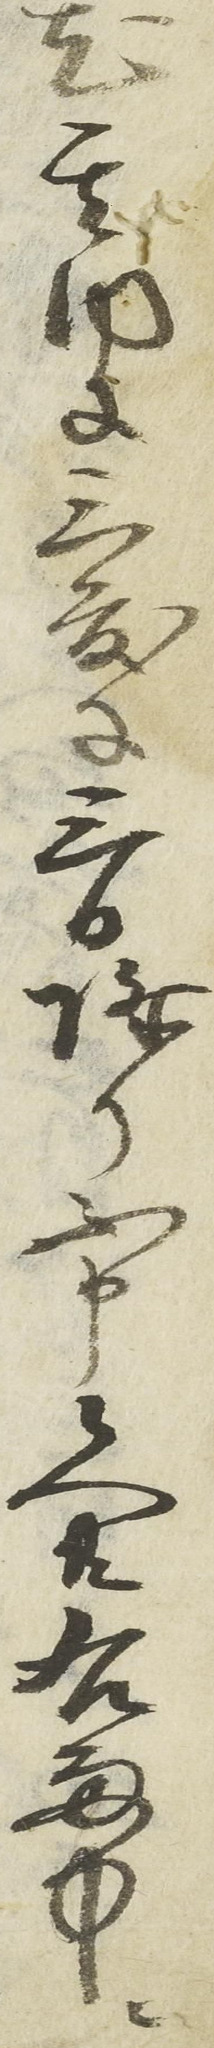尤其内に三度に三日降り不申候へ共右雨中ニ
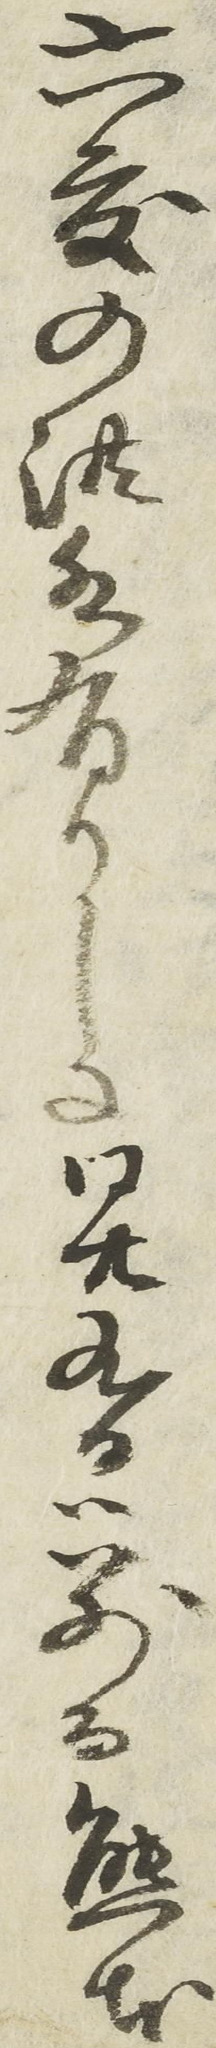六度の洪水有りしに同廿九日は別而熊本
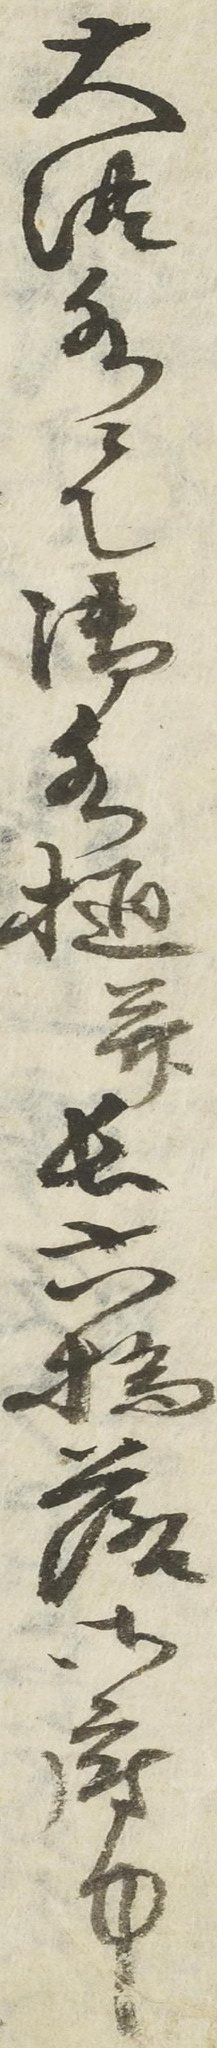大洪水ニて御水樋幷長六橋落御府中
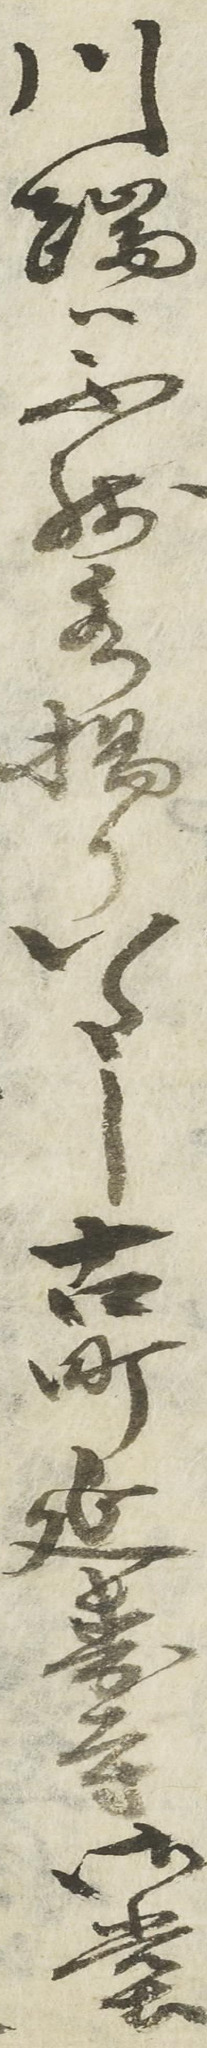川端は不残水揚りいたし古町延寿寺御堂
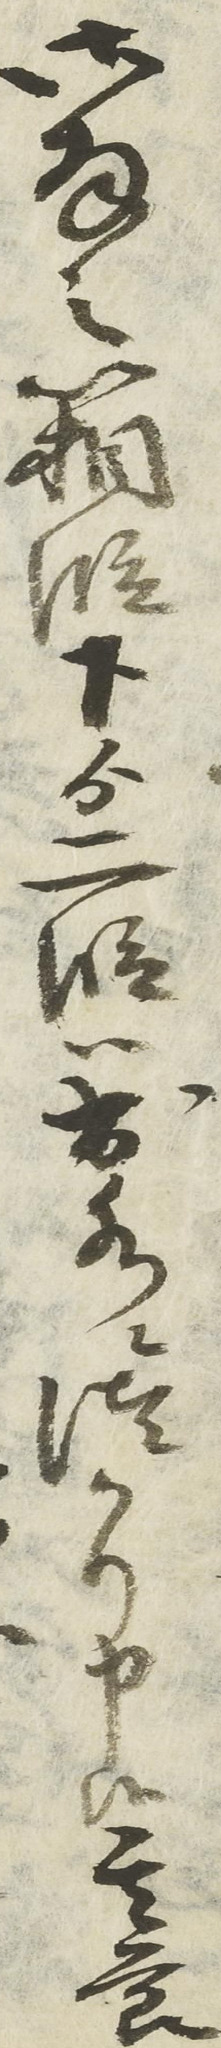御拝之箱段下ゟ二段は出水ニつかり申候其節
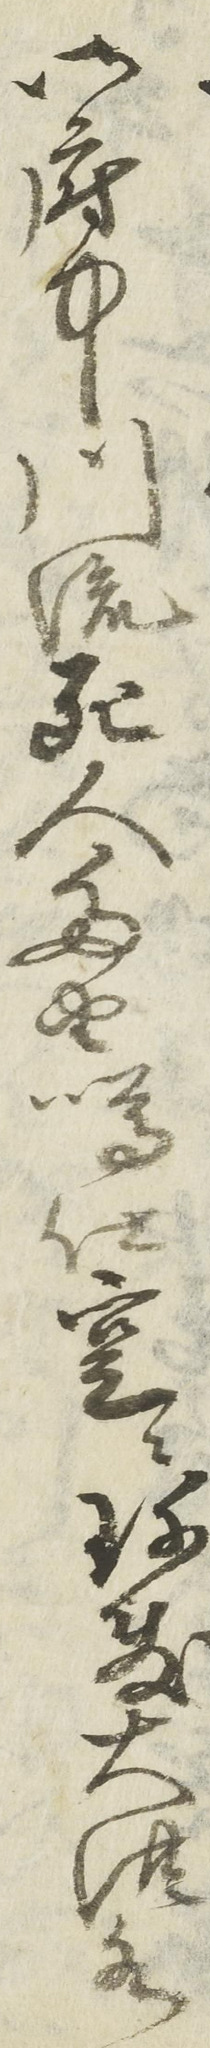御府中川流死人多由噂仕寔ニ珍敷大洪水
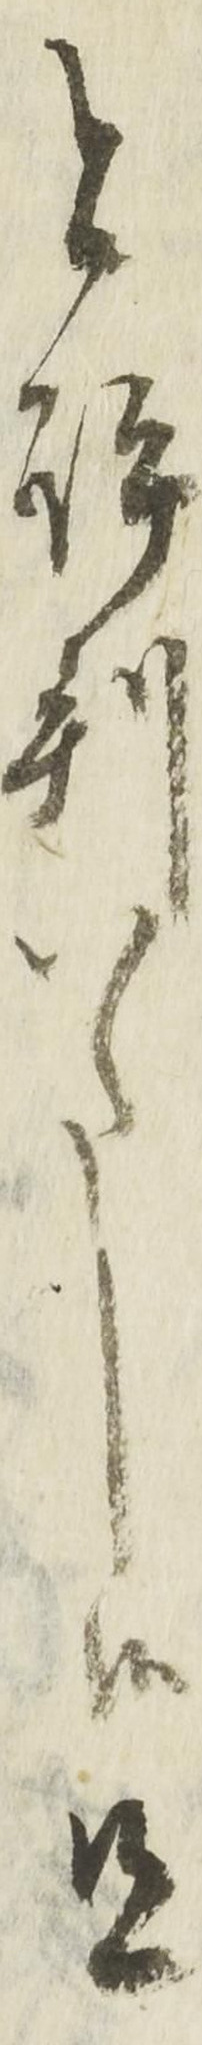と評判いたし候且
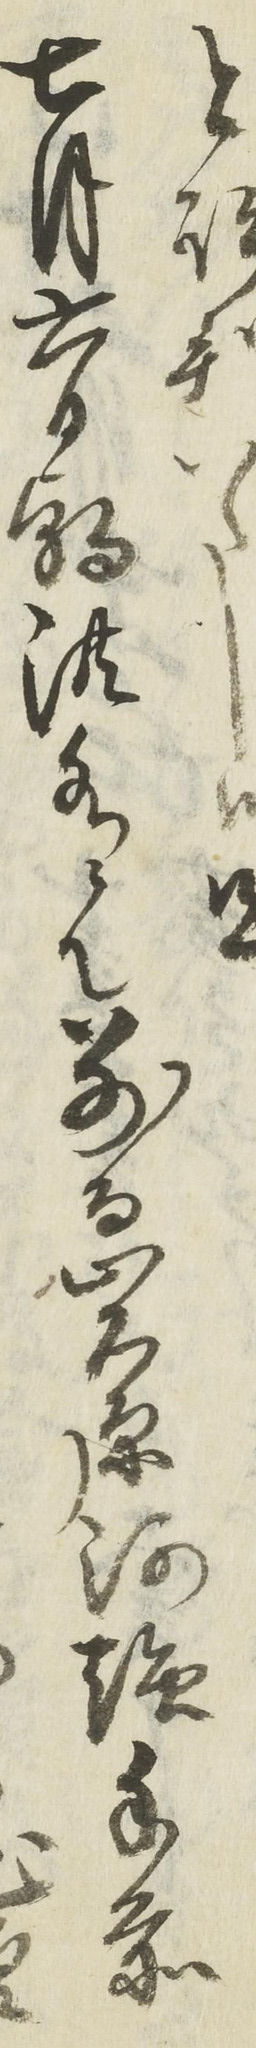七月六日朝洪水ニて別而岩原河端手前
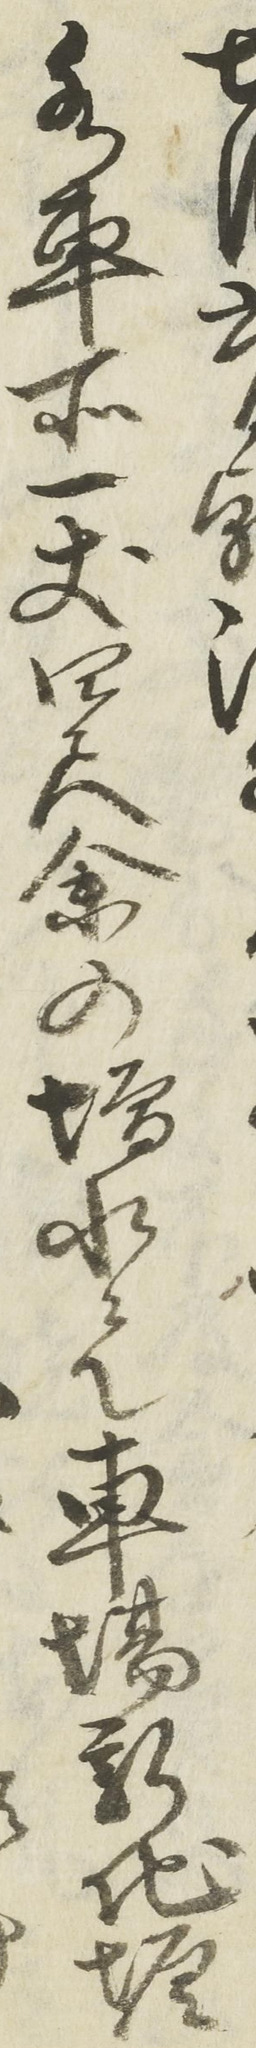水車所一丈四尺余の増水ニて車場新地塘
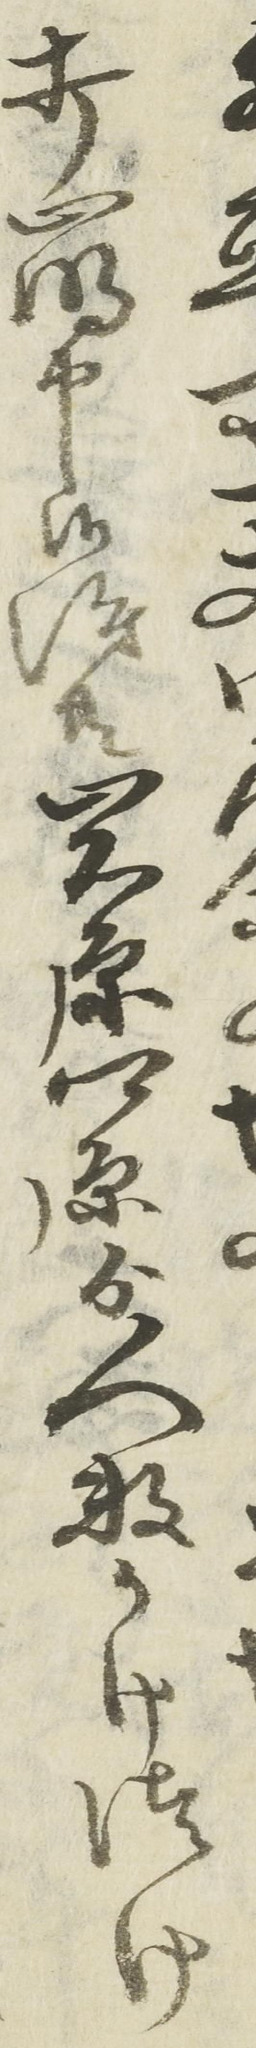打崩申候得共岩原郷原ゟ人数かけつけ
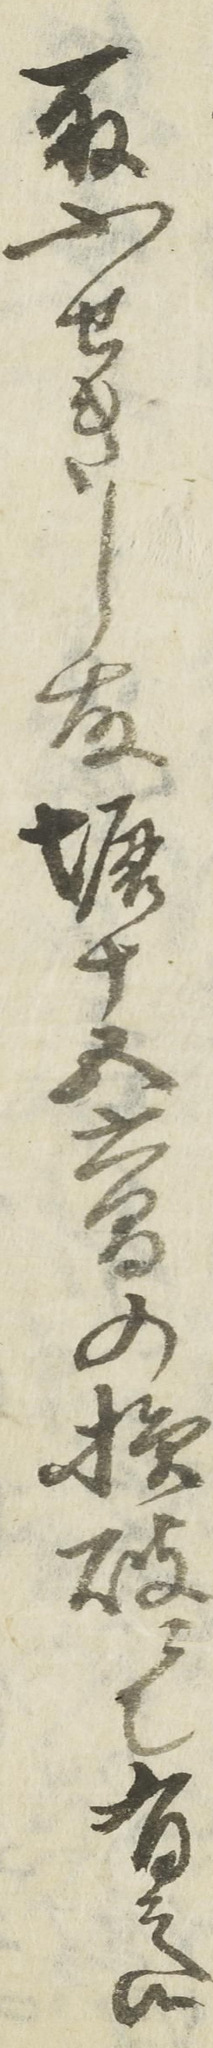取ふせきし故塘十五間の損破ニて有之候
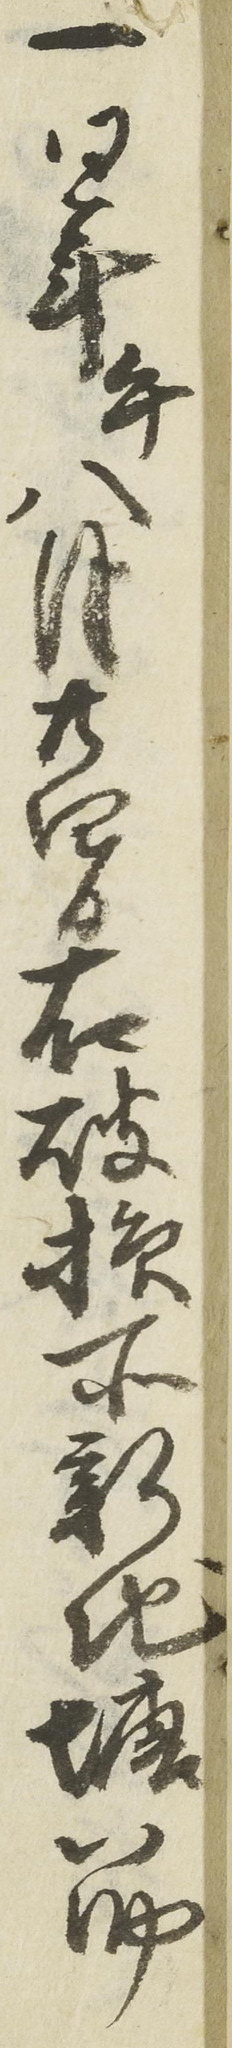一同年午八月廿四日右破損所新地壊筋
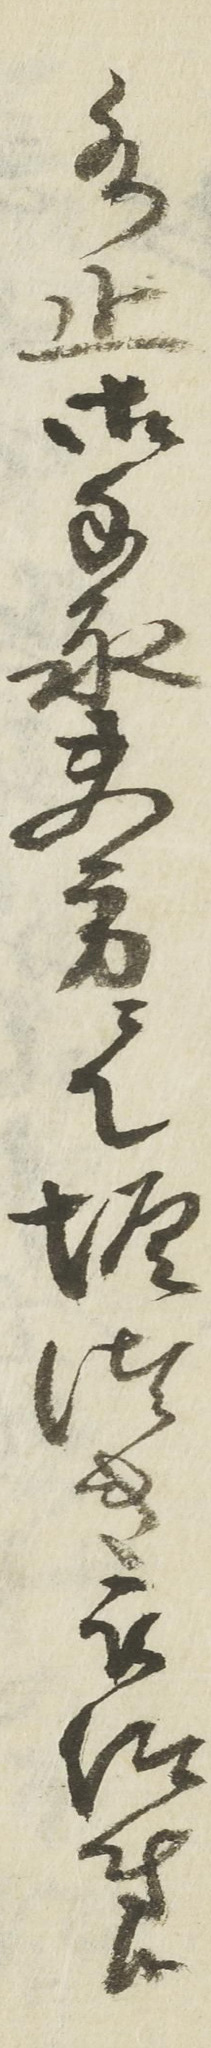水止御手承夫方ニて塘つき被仰付候
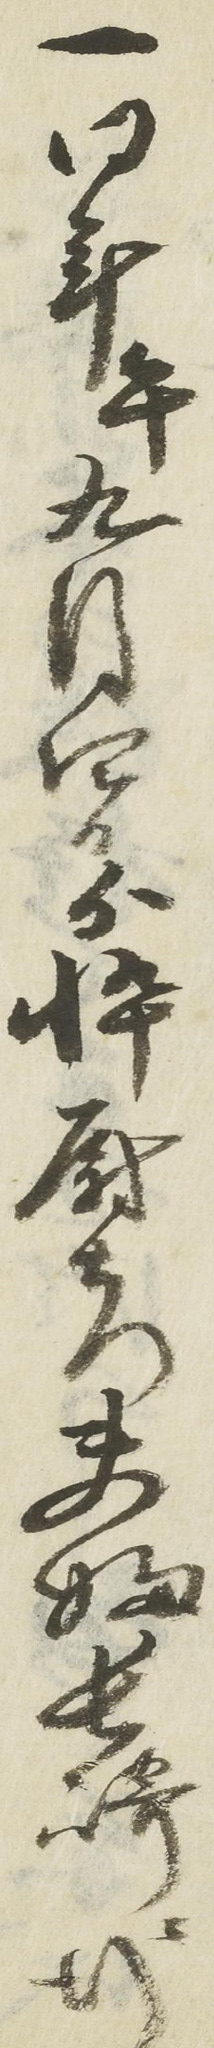一同年午九月四日ゟ忰厨右衛門夫婦長﨑ニ行
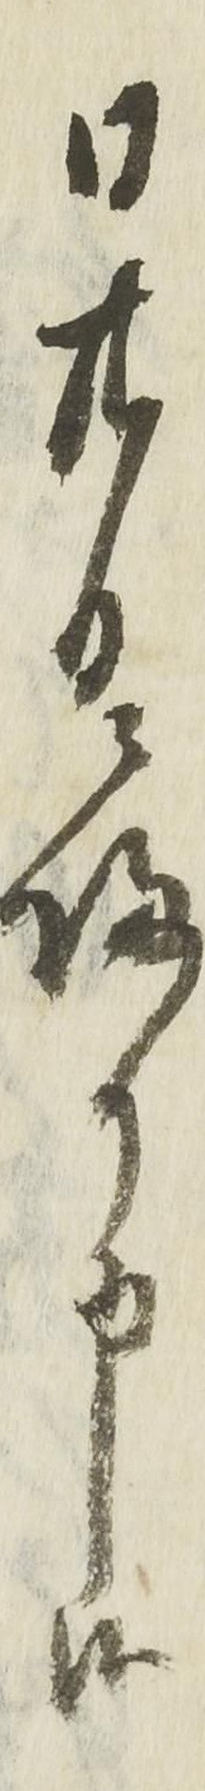同廿日ニ帰り申候
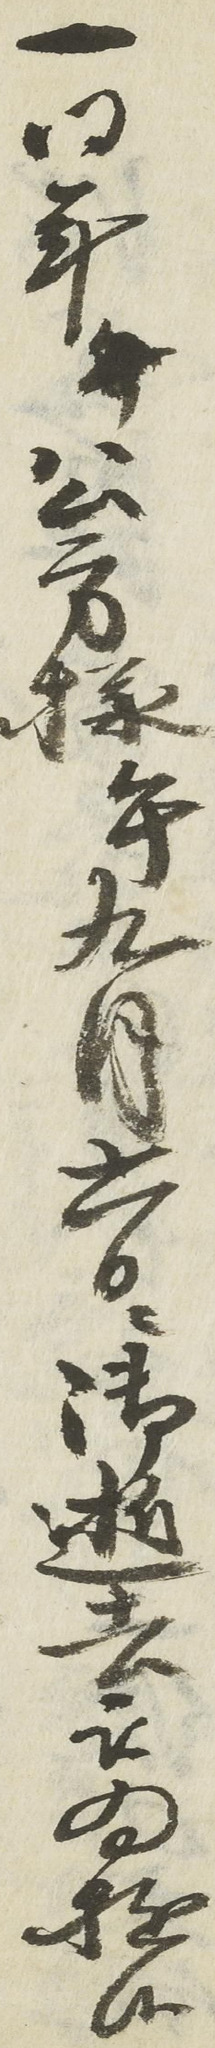一同年午公方様午九月六日ニ御逝去被為遊候
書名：後見笑
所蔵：東京大学地震研究所図書室 Earthquake Research Institute Library, The University of Tokyo, JAPAN
